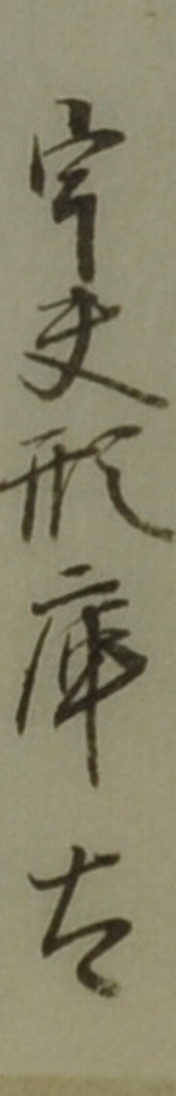宇夫形庫太
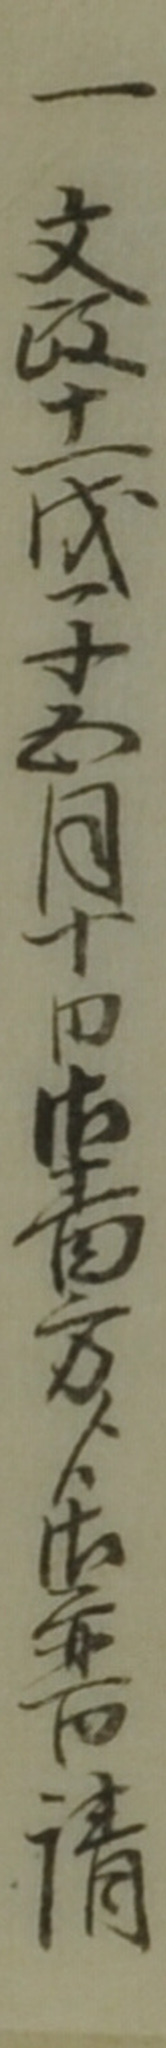一文政十一戊子五月十日御番方ゟ御普請
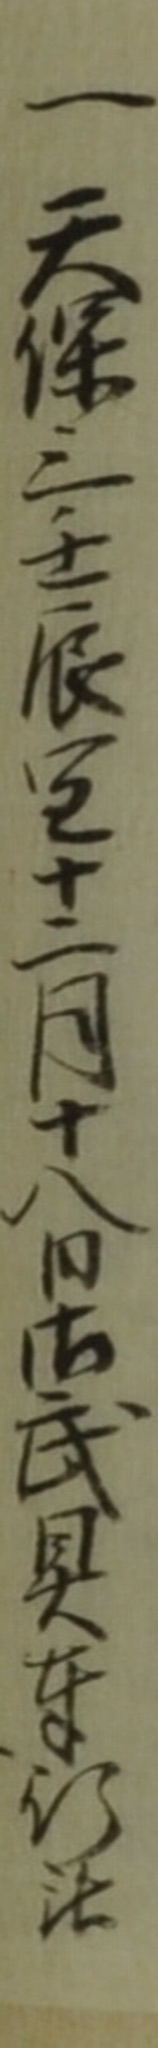一天保三壬辰閏十二月十八日御武具奉行被
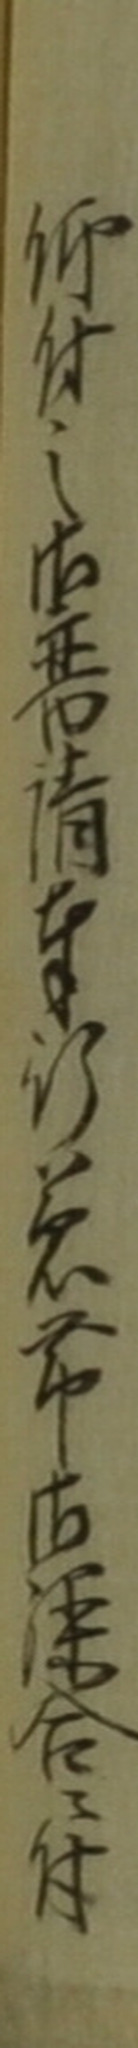仰付之御普請奉行兼帯御繰合ニ付
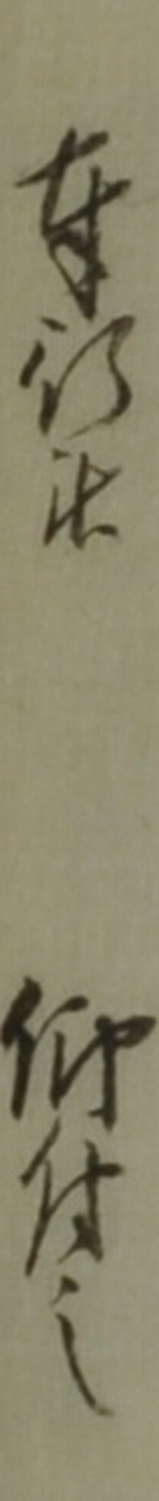奉行被仰付之
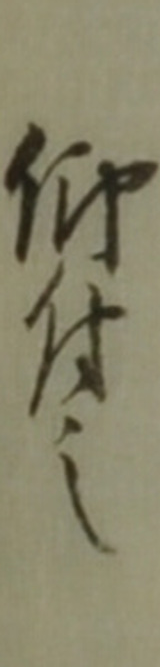仰付之
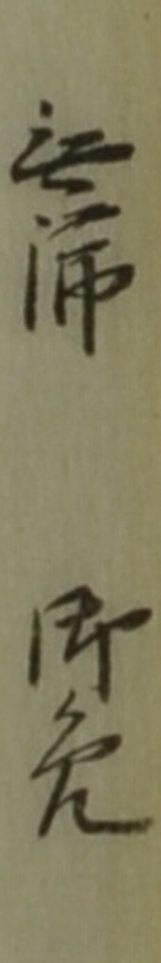無滞御免
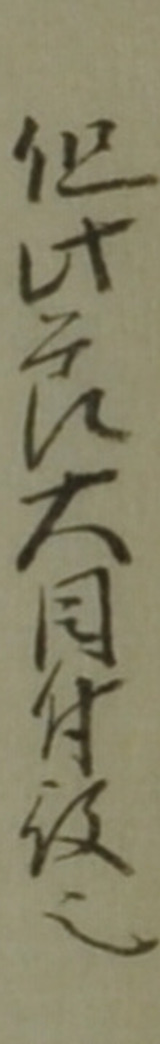但此節大目付役也
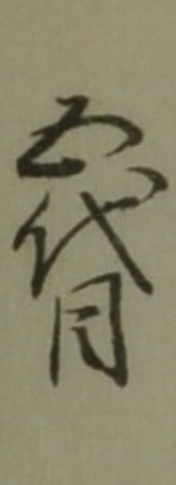五代目
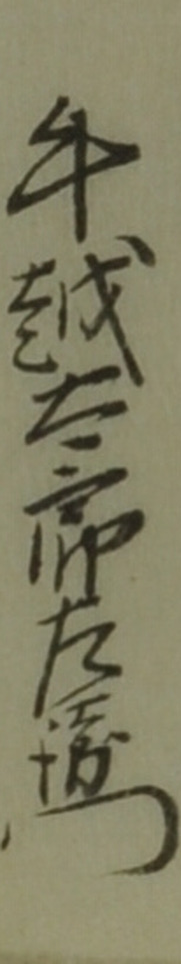牛越太郎左衛門
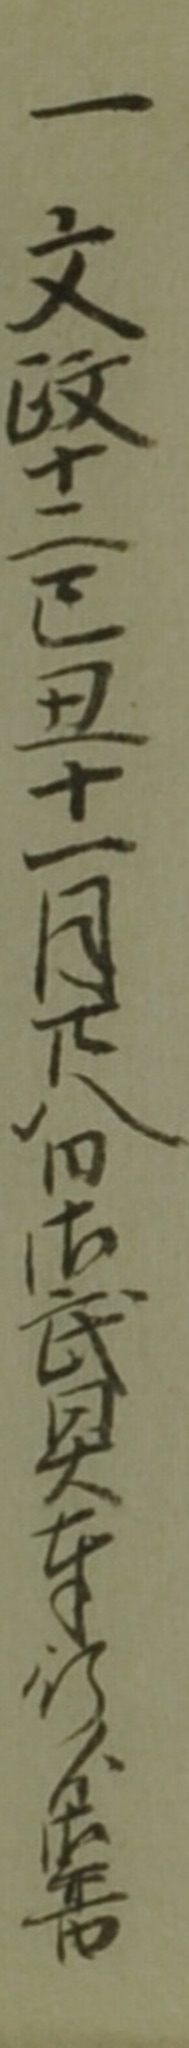一文政十二己丑十一月廿八日御武具奉行ゟ御普
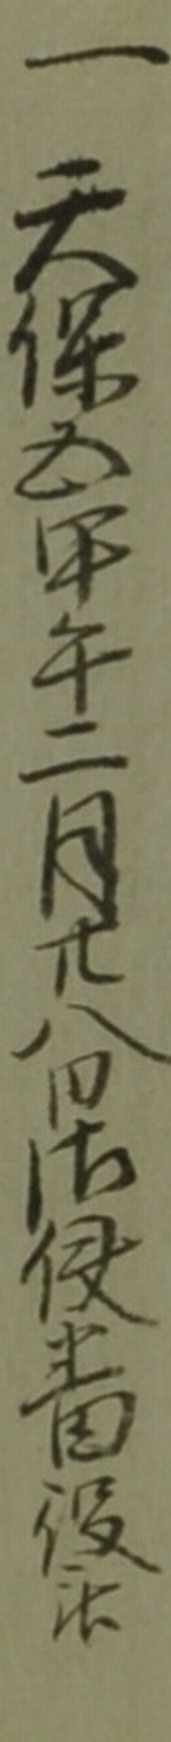一天保五甲午二月廿八日御使番役被
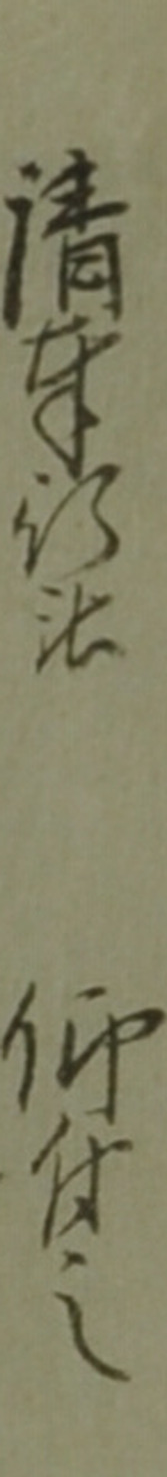請奉行被仰付之
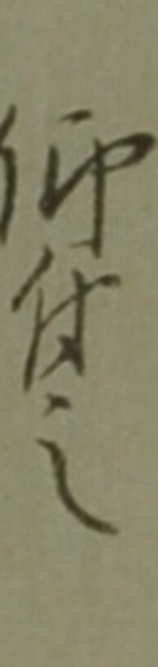仰付之
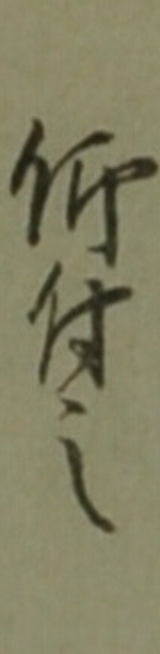仰付之
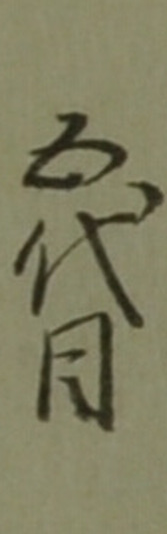五代目
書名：諸御役代々録（六）
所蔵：伊那市立高遠町図書館・合同会社AMANE
